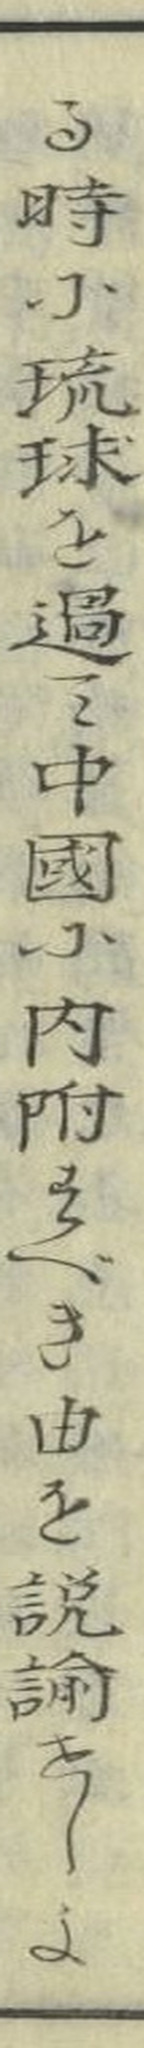る時に小琉球を過て中国に内附すべき由を説諭せしよ
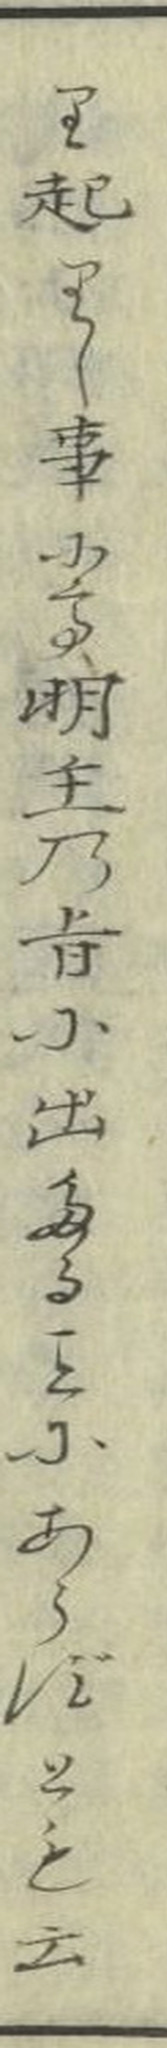り起りし事にて明王の旨に出たることにあらずとも云
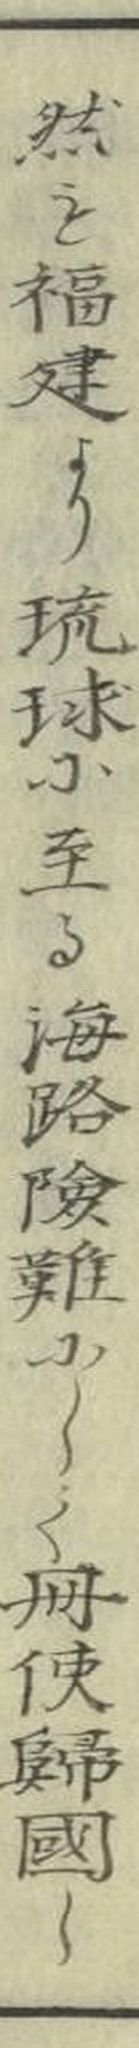然も福建より琉球に至る海路険難にして冊使帰国し
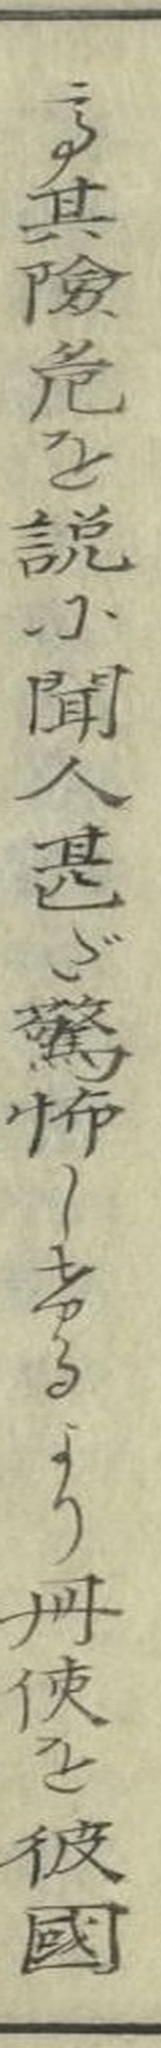て其険危を説に聞人甚だ驚怖しけるより冊使を彼国
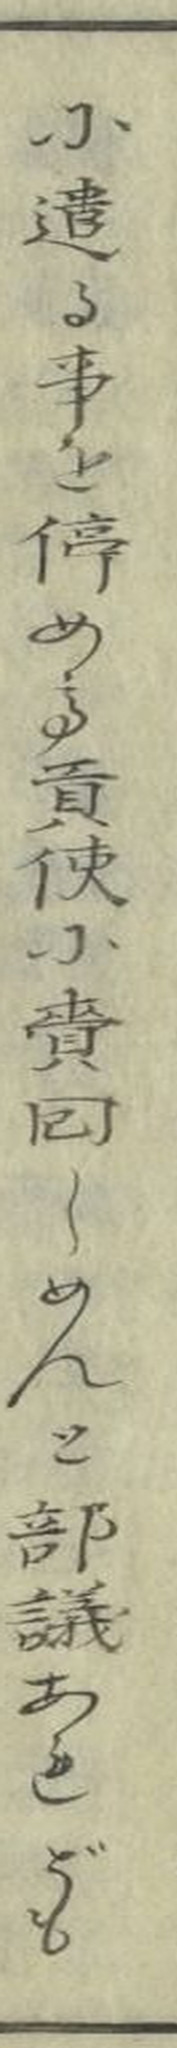に遣る事を停めて貢使に賚回しめんと部議あれども
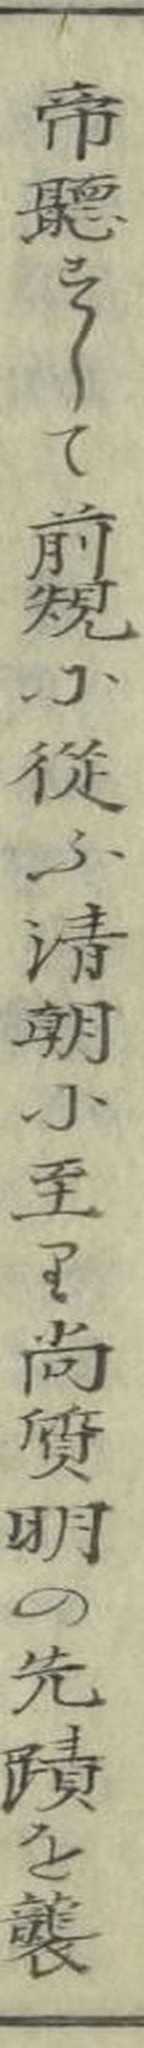帝聴すして前規に従ふ清朝に至り尚質明の先蹟を襲
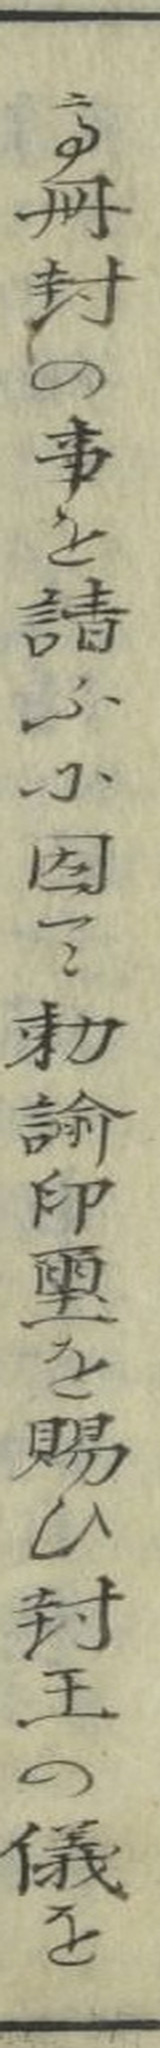て冊封の事を請ふに因て勅諭印壐を賜ひ封王の儀を

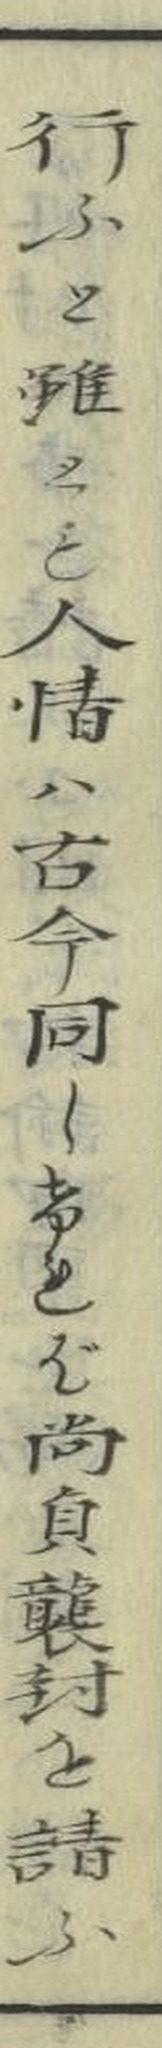行ふと雖とも人情は古今同しければ尚貞襲封を請ふ
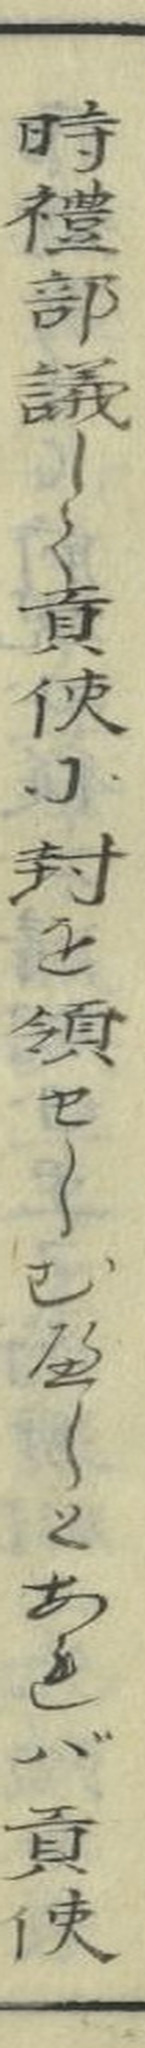時礼部議して貢使に封を領せしむへしとあれば貢使
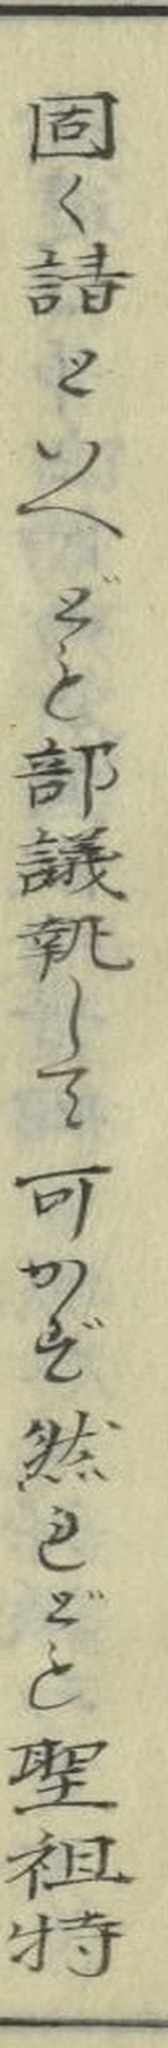固く請といへども部議執して可かず然れども聖祖特
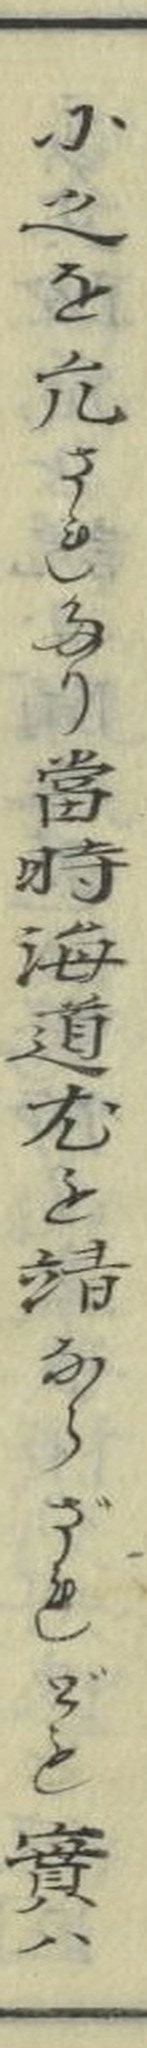に之を允されたり当時海道尤も靖ならざれども実は
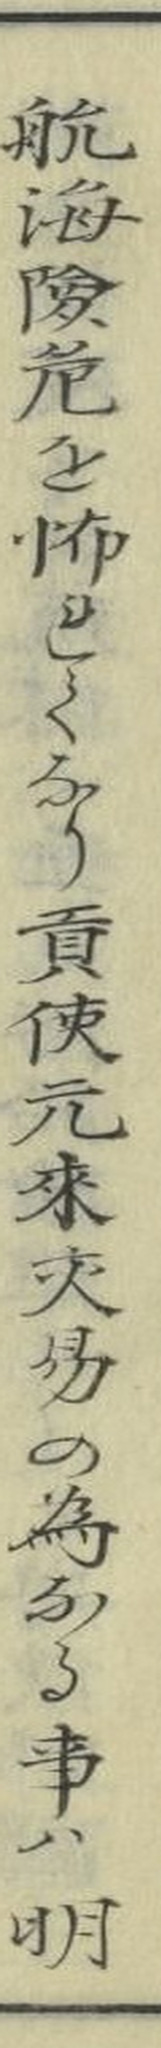航海険危を怖れてなり貢使元来交易の為なる事は明

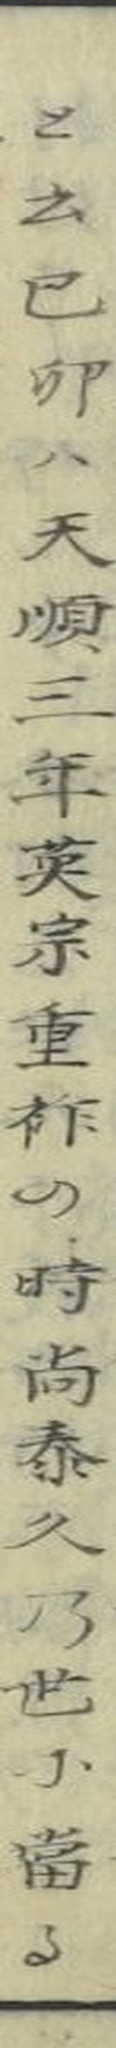と云己卯は天順三年英宗重祚の時尚泰久の世に当る
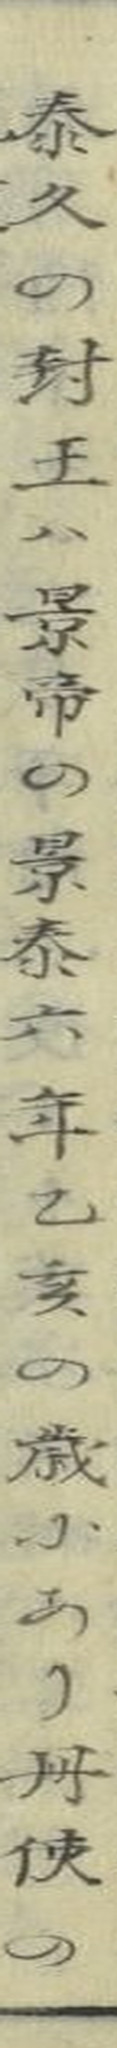泰久の封王は景帝の景泰六年乙亥の歳にあり冊使の
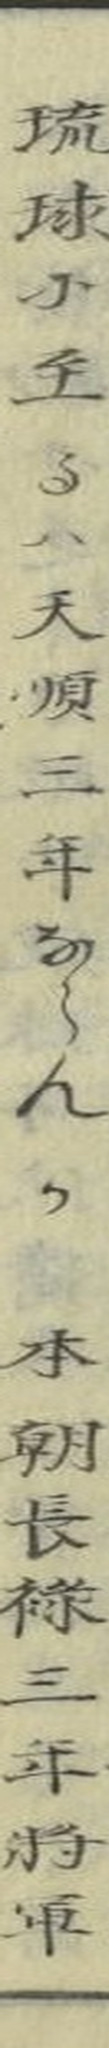琉球に至るは天順三年ならんか本朝長禄三年将軍
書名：琉球沿革志 下
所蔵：University of the Ryukyus Library
